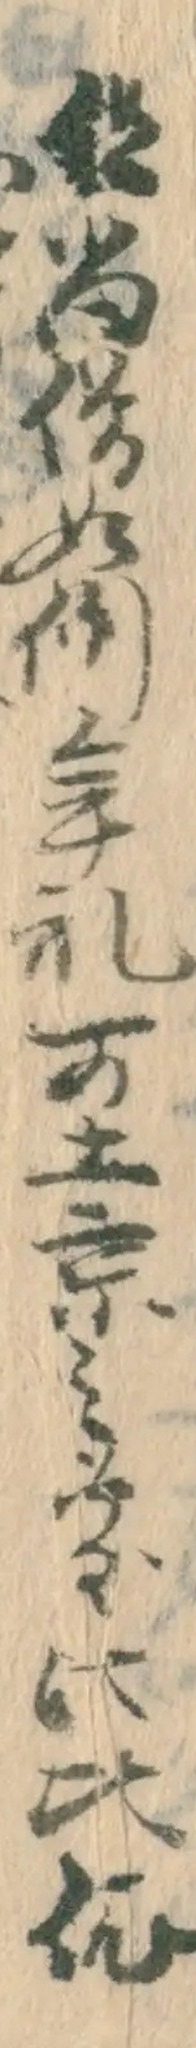但尚僧如例年礼可上京之処此頃依
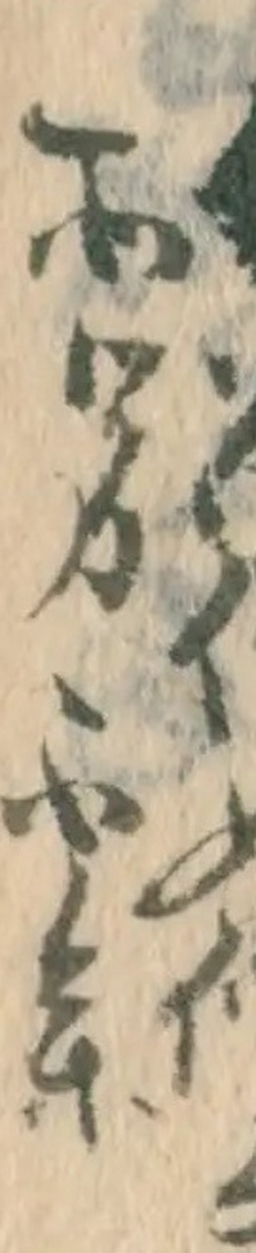所労不参

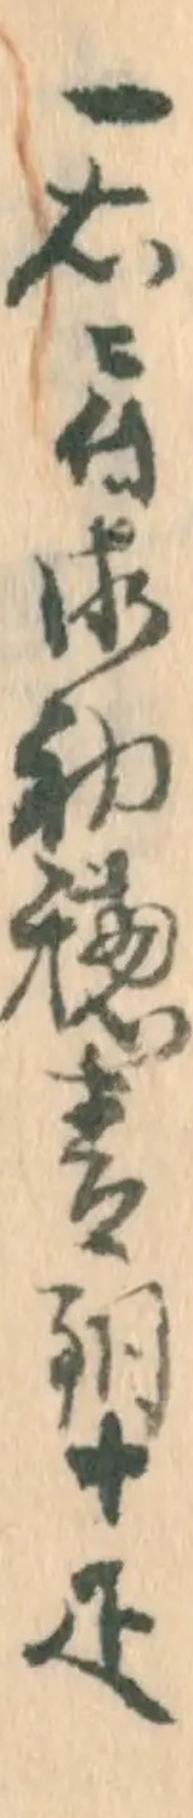右ニ付御初穂青銅十疋
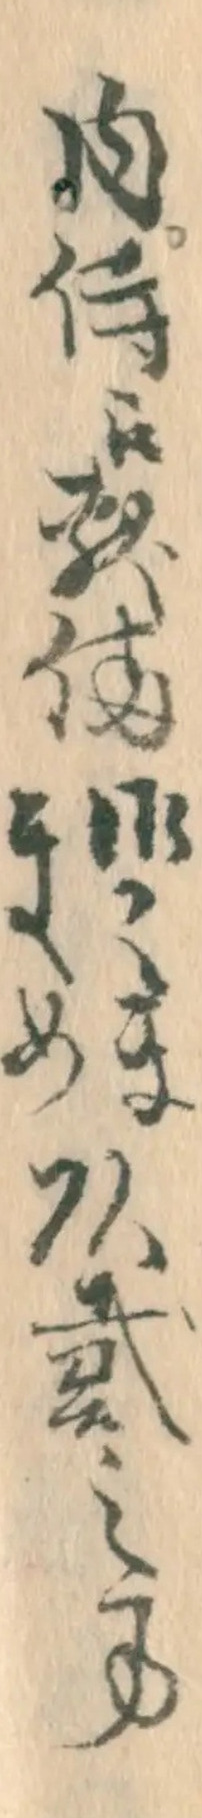内侍え献備御こま頂戴之事
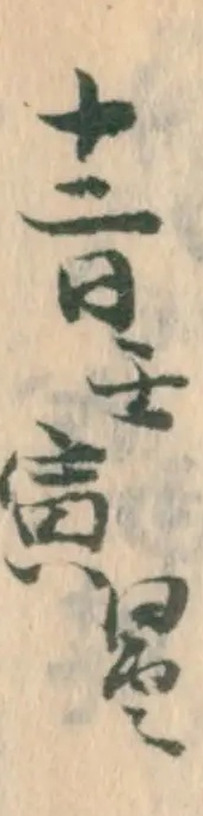十二日壬寅曇
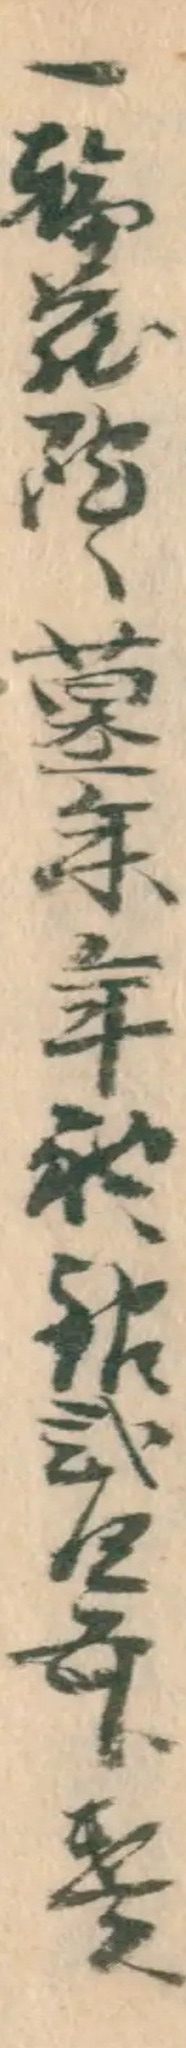一輪蔵院へ墓参年礼銀弐匁五分遣ス
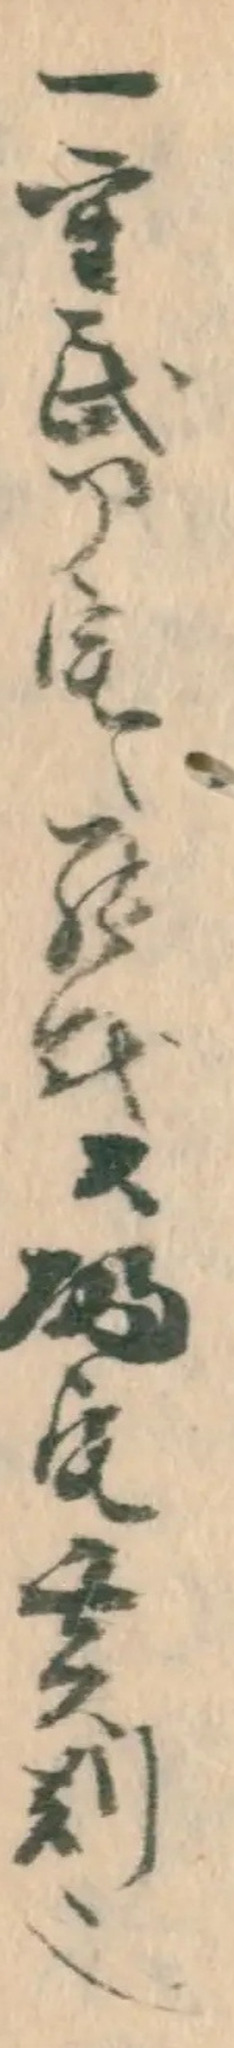一重民部宅へ罷越ス帰宅亥刻也
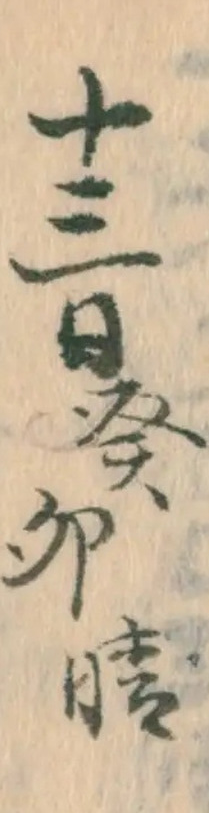十三日癸卯晴
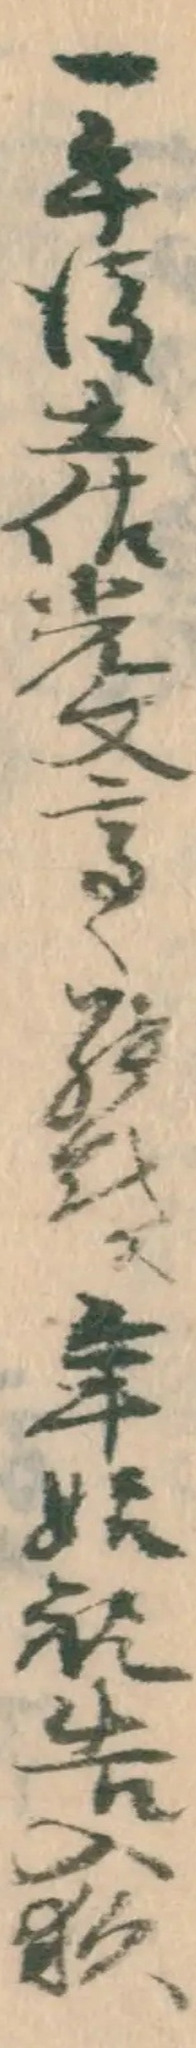一午後土佐光文高へ罷越ス年始祝出ル入夜
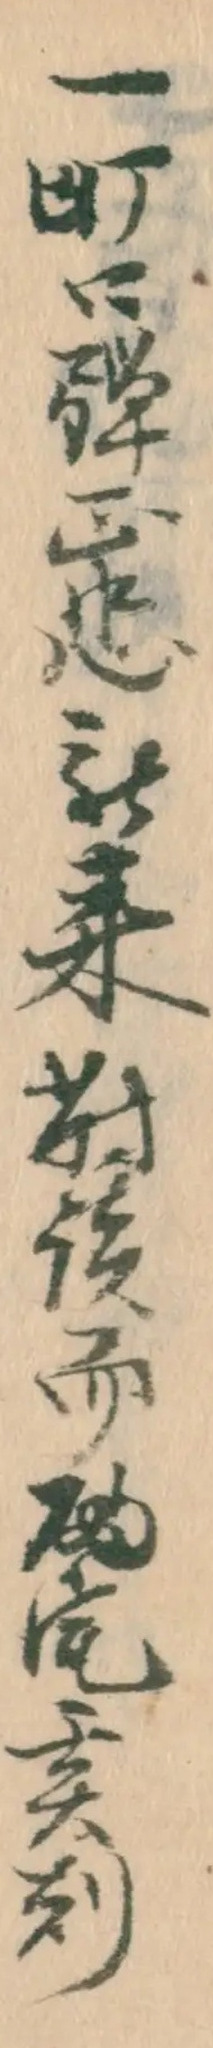一町口弾正忠被来対談而帰宅亥刻
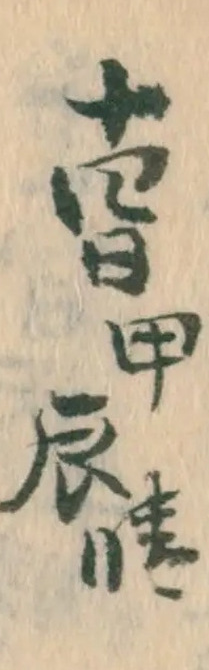十四日甲辰晴
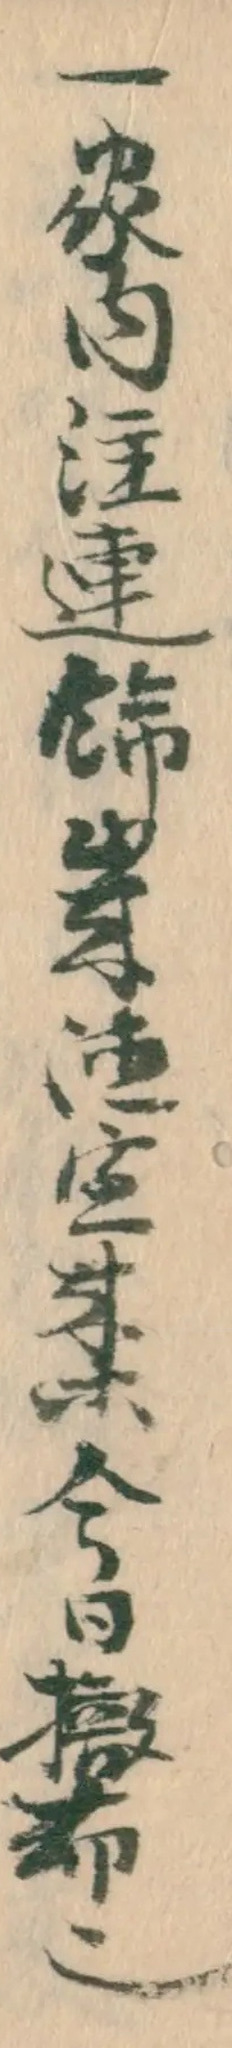一家内注連飾歳徳宝来等撤却也
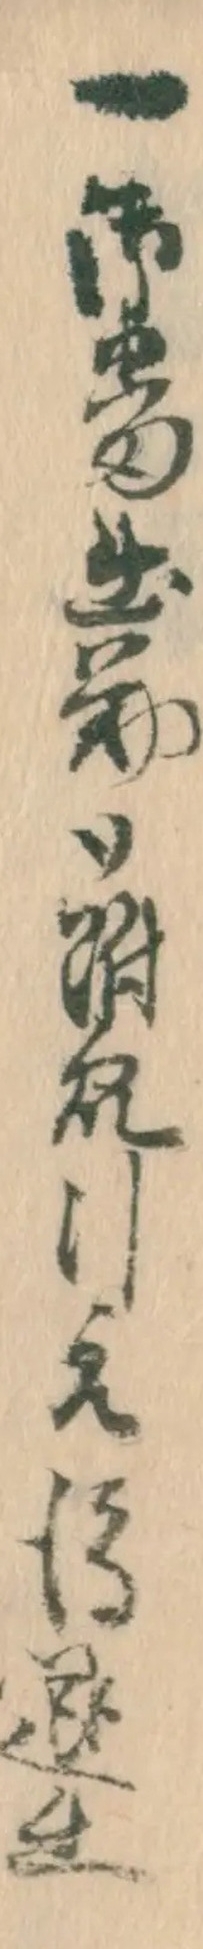一御番出勤御附衆引取後退出
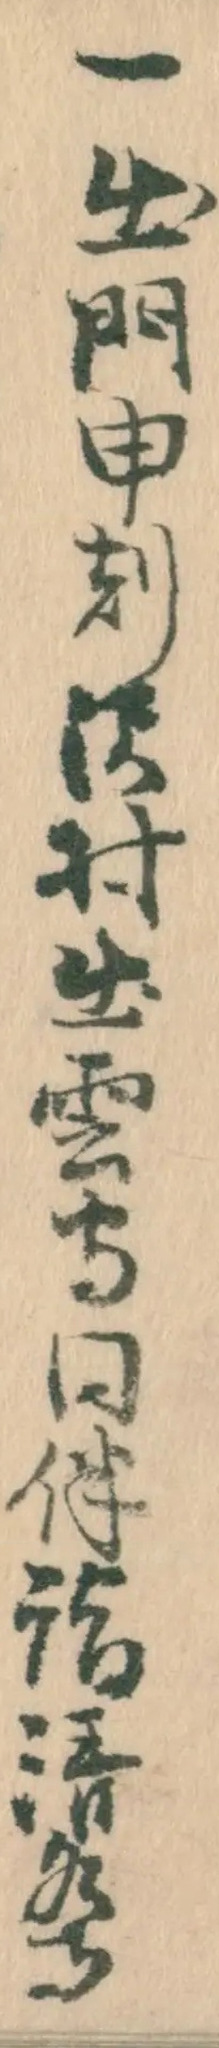一出門申刻沢村出雲守同伴詣清水寺
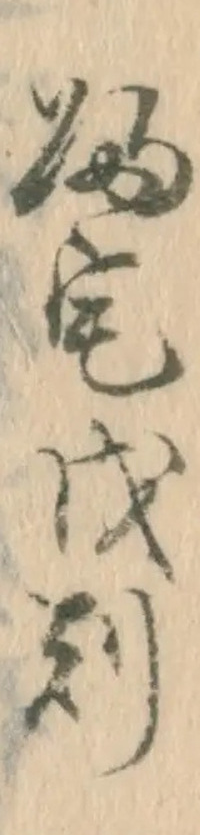帰宅戌刻

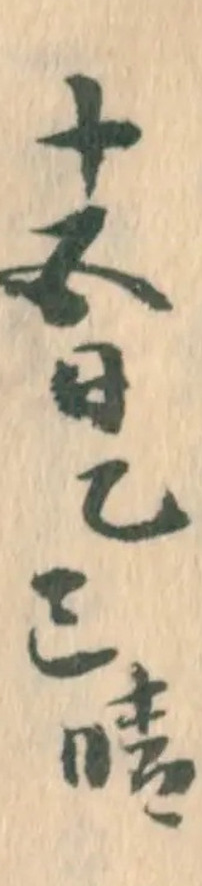十五日乙巳晴
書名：禁裏御所御用日記. [131]
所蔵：国立国会図書館 National Diet Library, JAPAN
